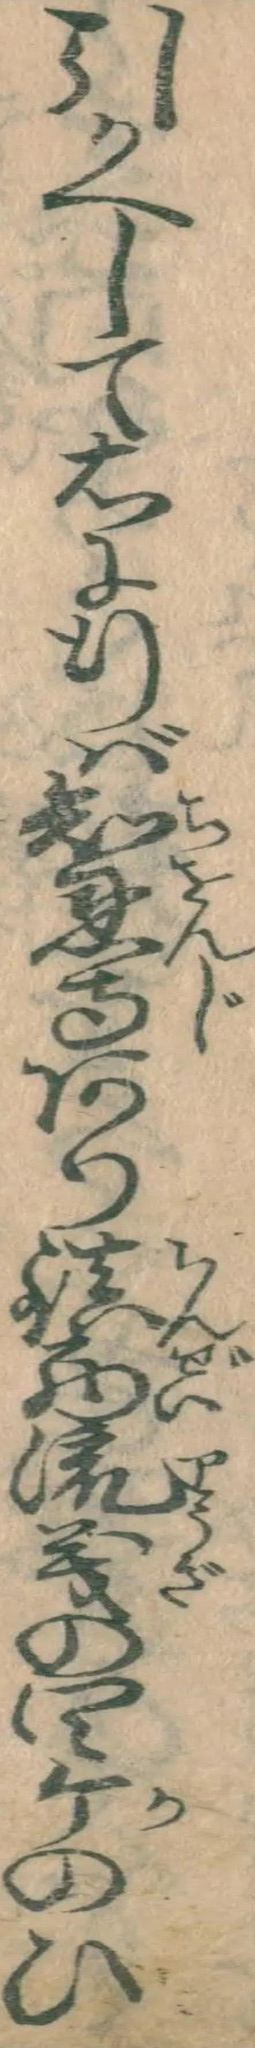引かへして右に行ば知恩寺あり鎮西流義の四ケのひ
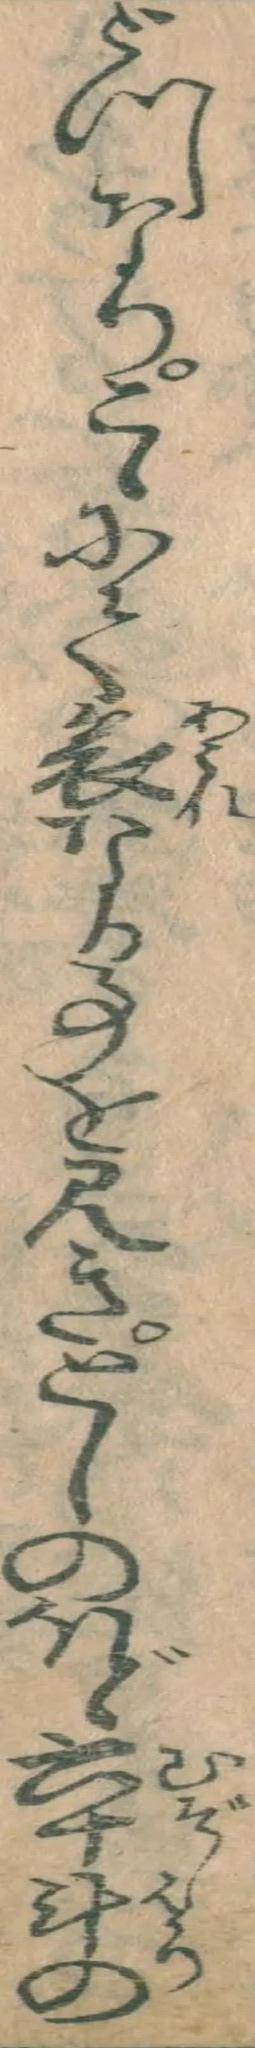とつなり。こゝにて哀なる事を見き。としのほど六十斗の
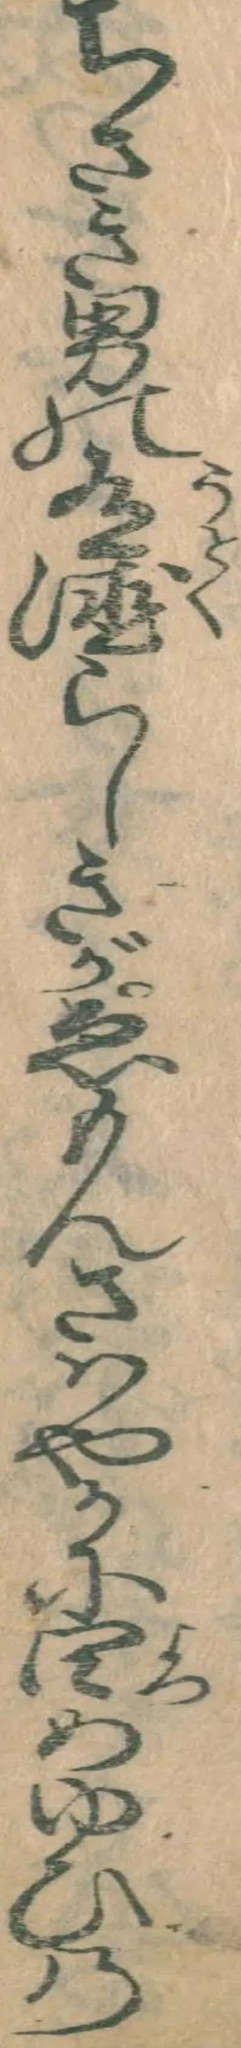ちさき男の有徳らしきが。ゑもんさはやかに四めゆひの

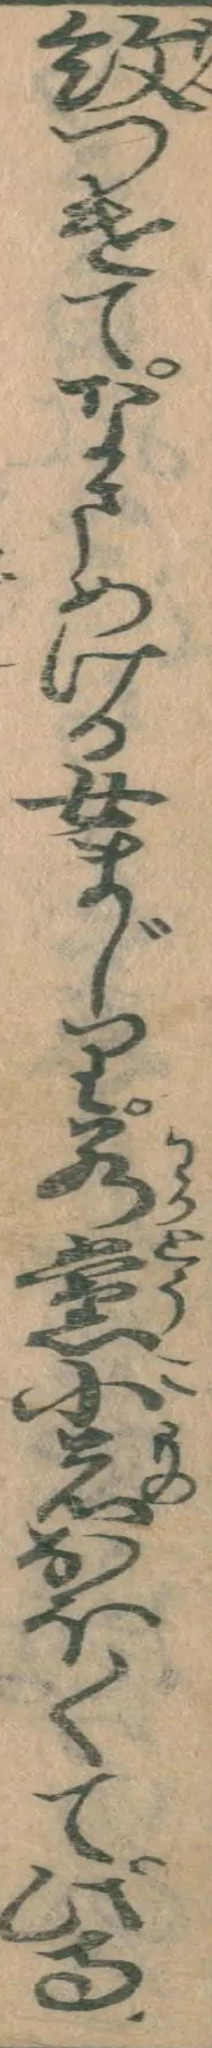紋つけて。なまめける女まじり。若党小者おほ〱て。此寺
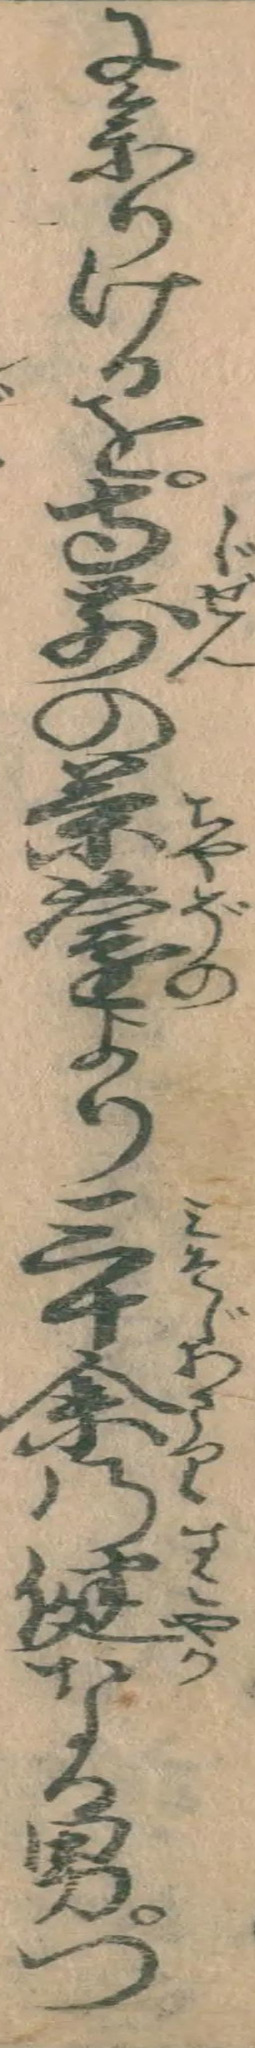に参りけるを。寺前の茶園より三十余の健なる男。つ
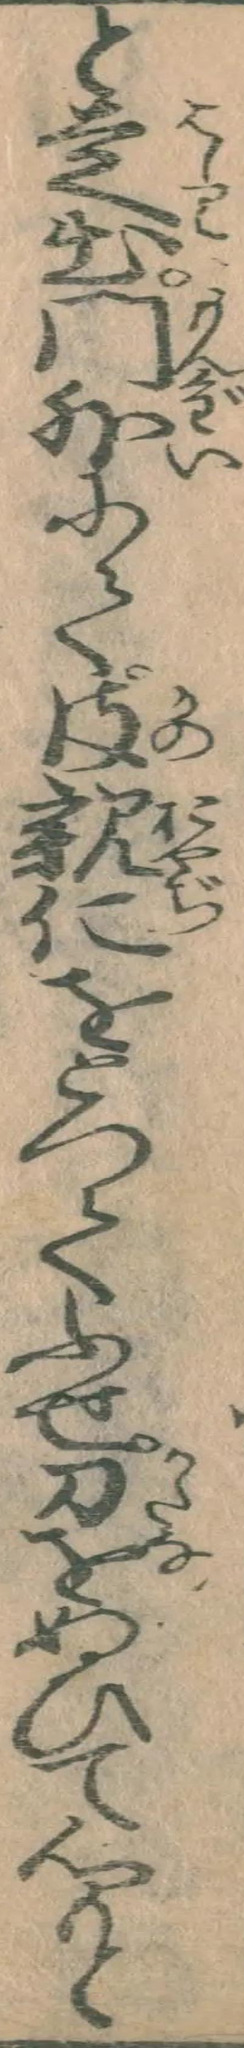と走出。門外にて。彼親仁をとつてふせ。刀をぬひて心もと
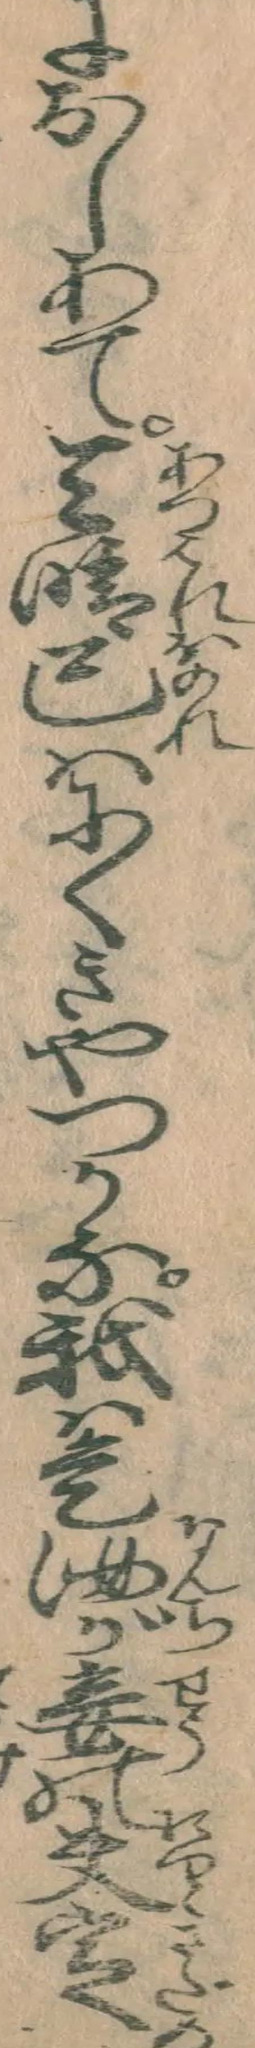におしあて。天晴己はにくきやつかな。我は是汝が妾の夫定
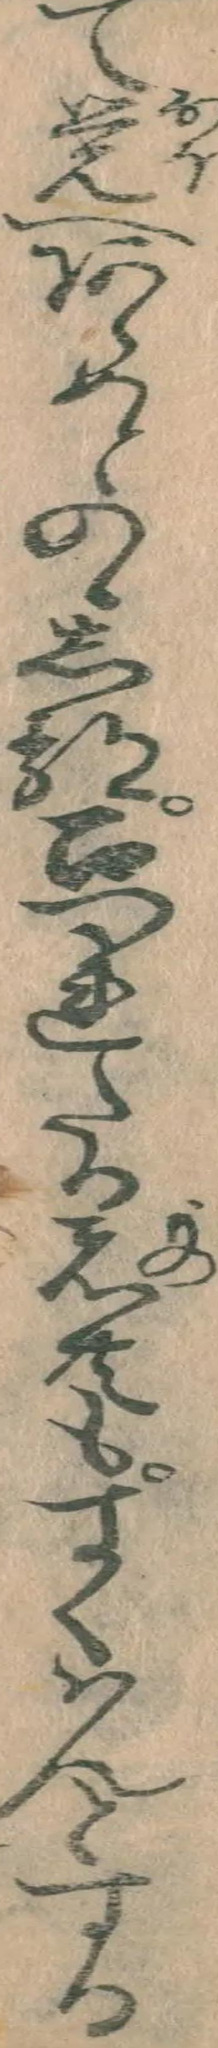て覚へあらめとのゝしる。召つれたる者共も。すくはんとする
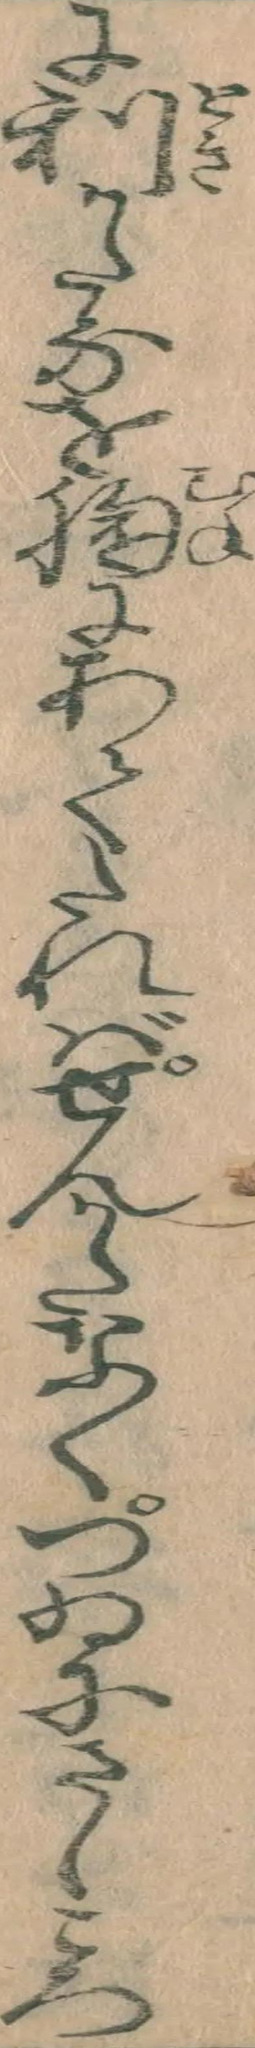に利かたなを胸にあてたれば。せんかたなく。つゐにさしころ
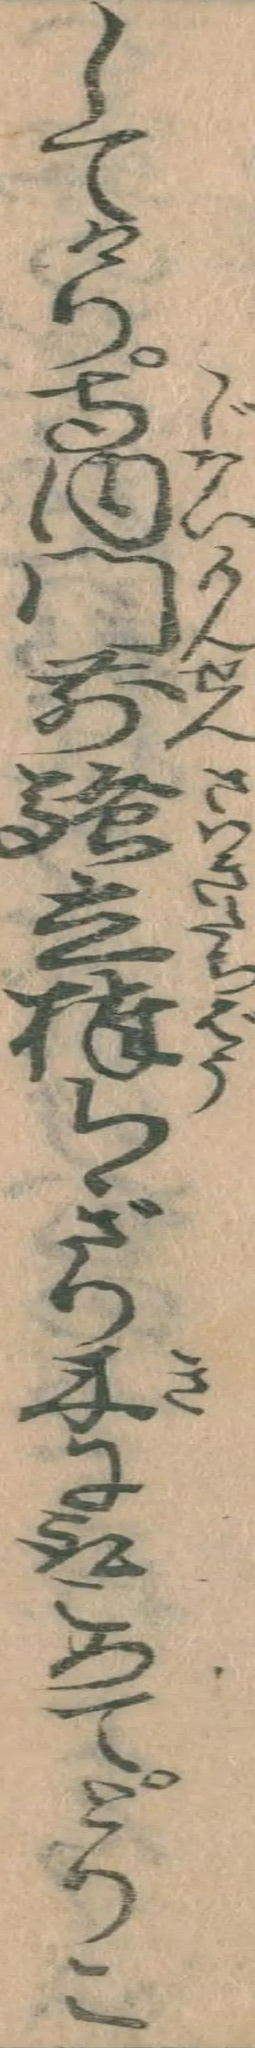してけり。寺内門前騒立棒ちぎり木に取こめて。とりこ
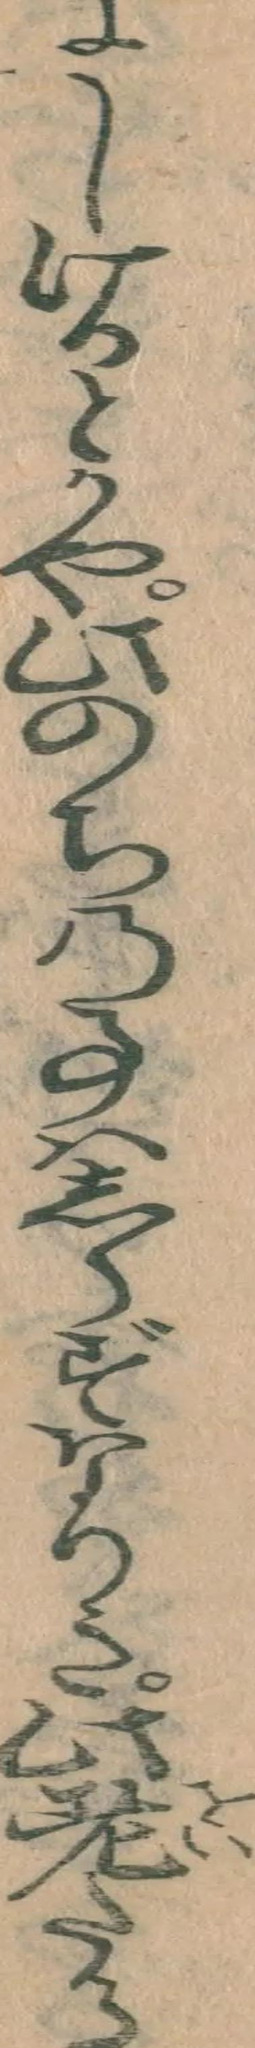にしけるとかや。此のちの事はしらずなりき。此老たる
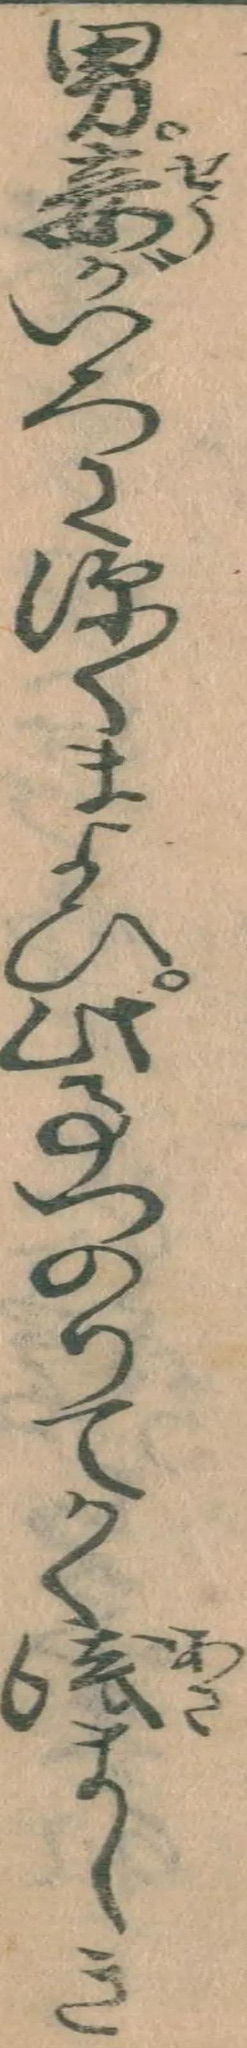男。妾がいろに深くまよひ。此事つのりてかく浅ましき
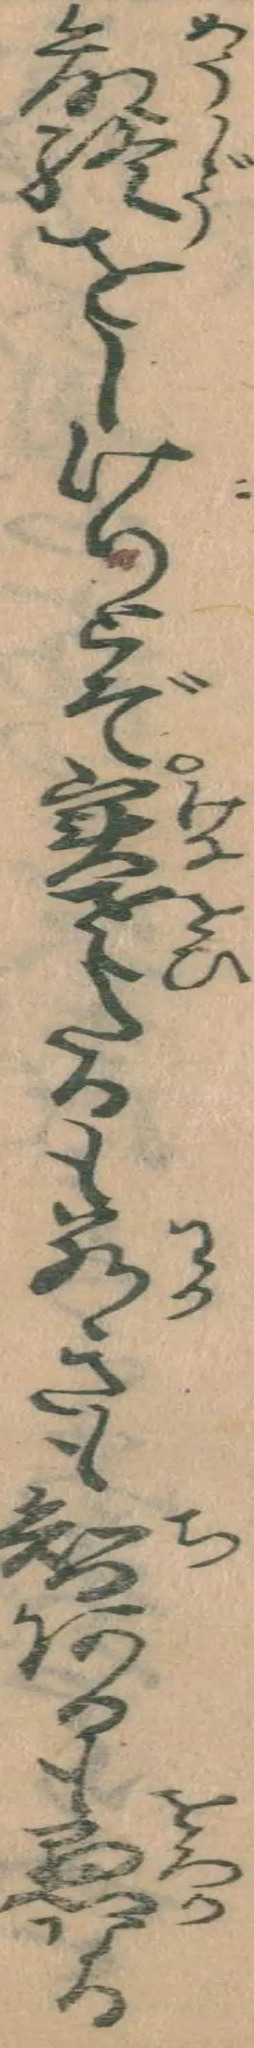命終をしけりとぞ。実老たるも若きも智あるも愚なる
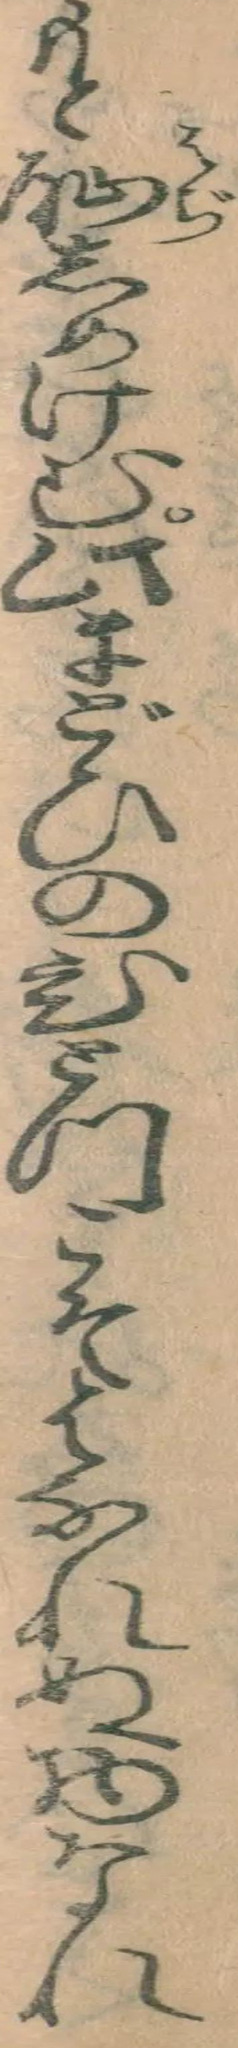もと恥しめけむ。此まどひのひとつこそはなれぬ物なれ
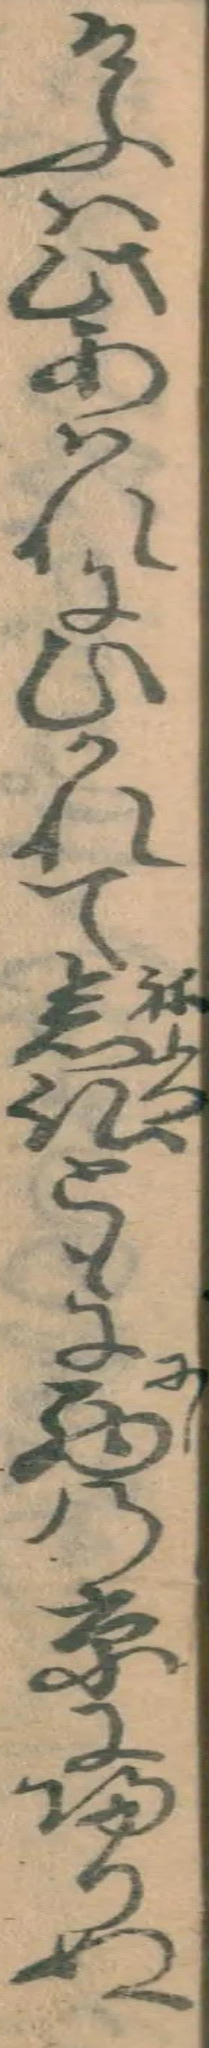けふは此あはれにひかれて念仏ともに西の京に帰りぬ
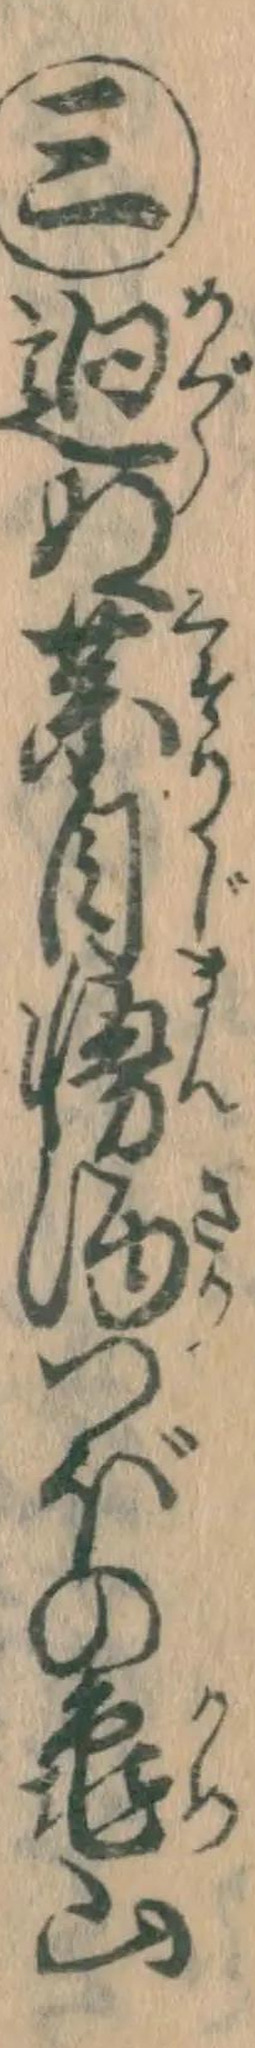三廻ぬ薬自慢酒つぼの亀山
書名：新竹斎 5巻
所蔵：国立国会図書館 National Diet Library, JAPAN
